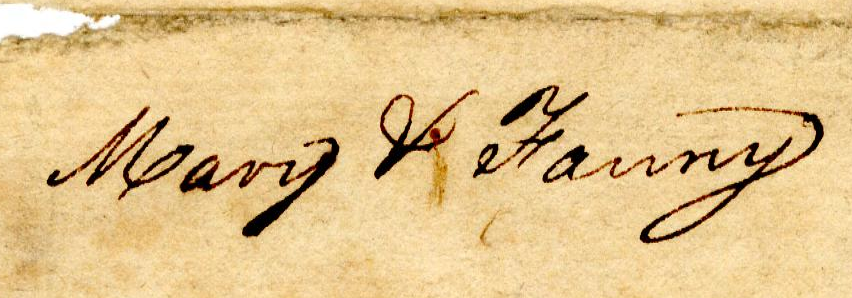Mary & Fanny
